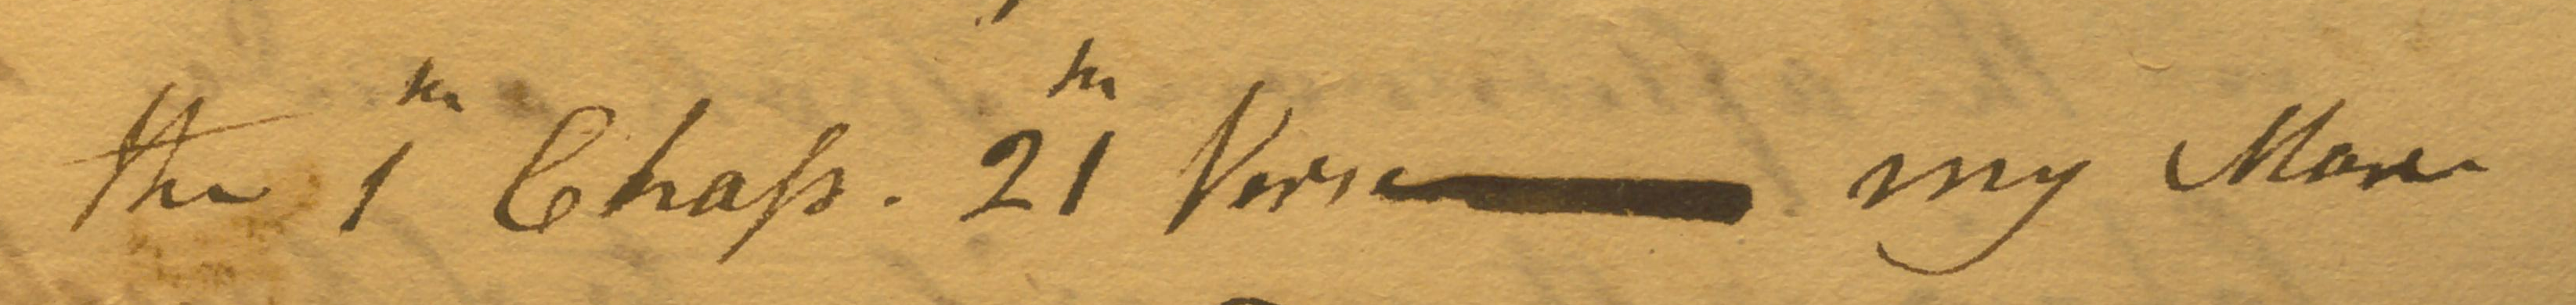the 1^th Chaps. 21^th Verse my Mare
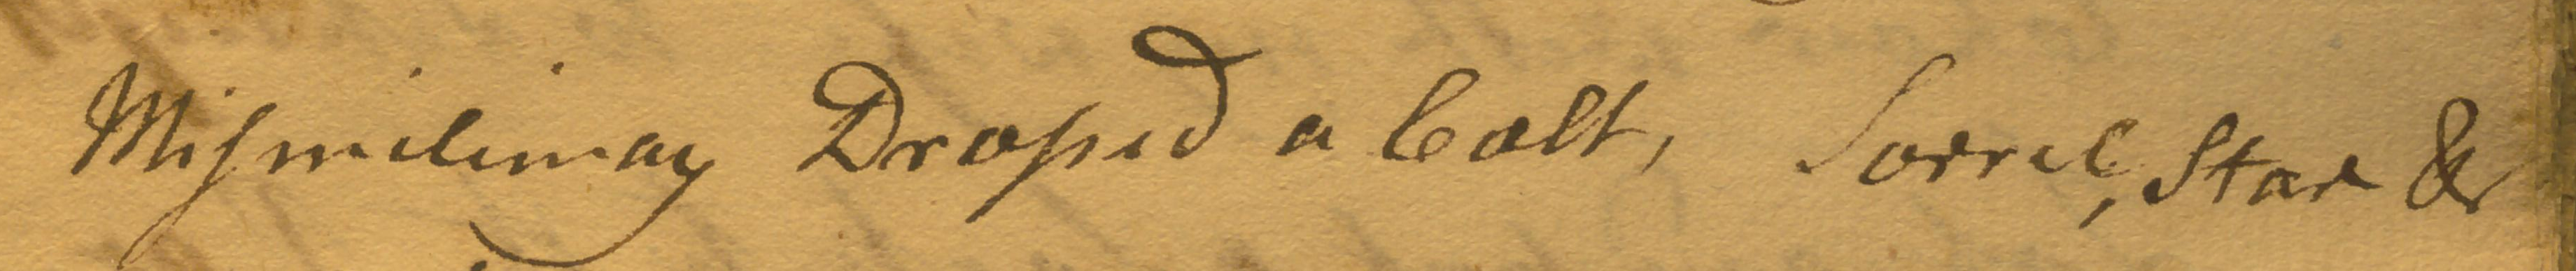Mismilimay Droped a Colt, Sorrel, Star &
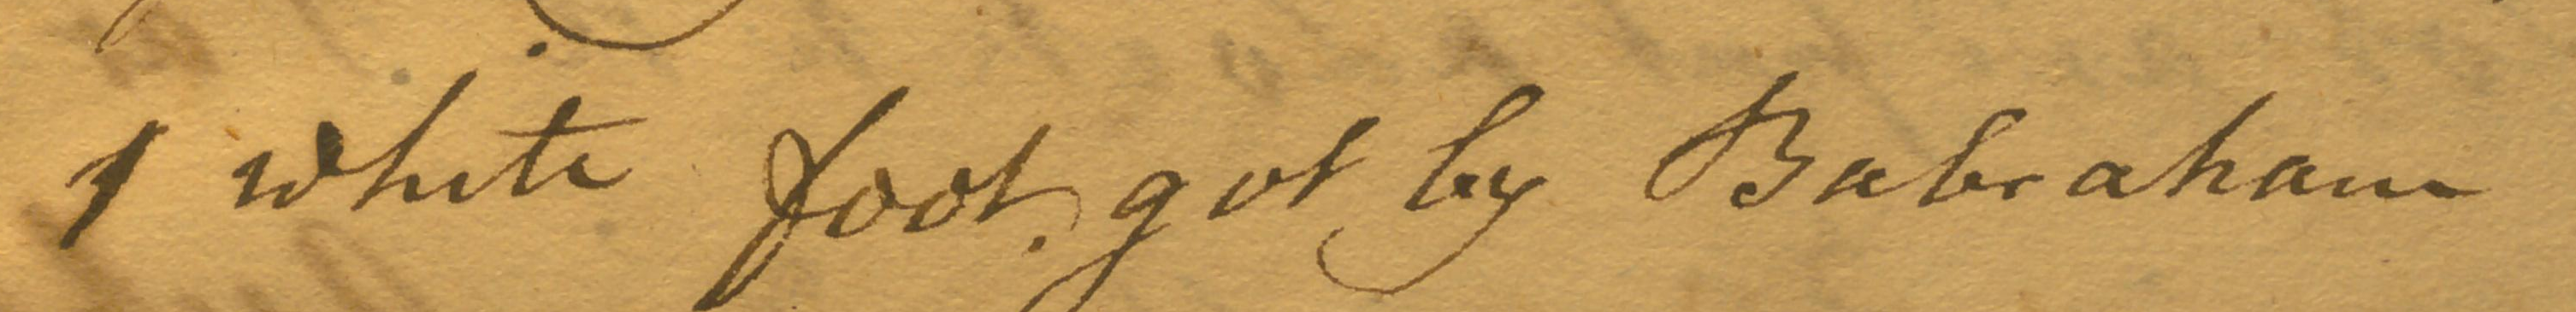1 white foot got by Babraham
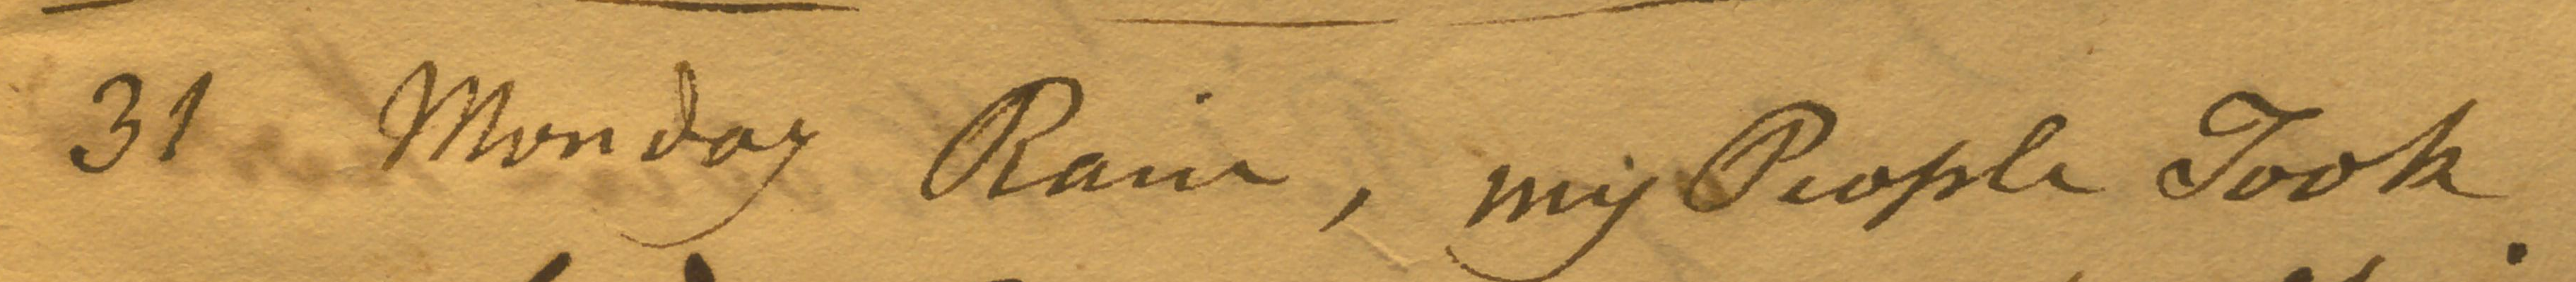31 Monday Rain, my People Took
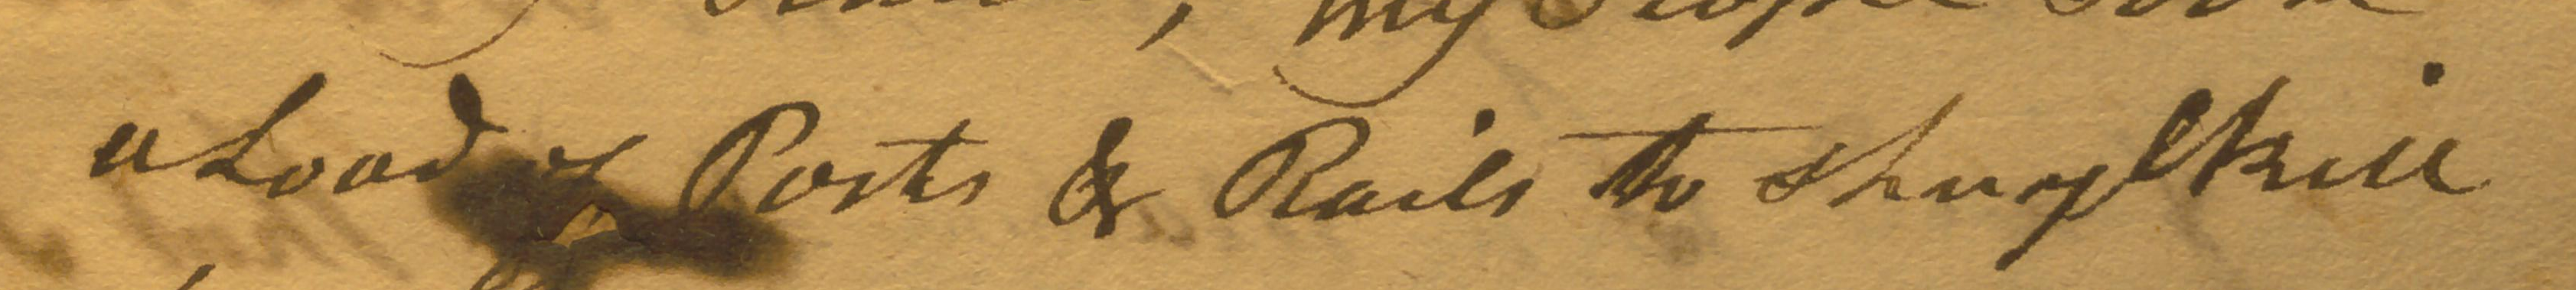a Load of Ports & Rails to shuylkill
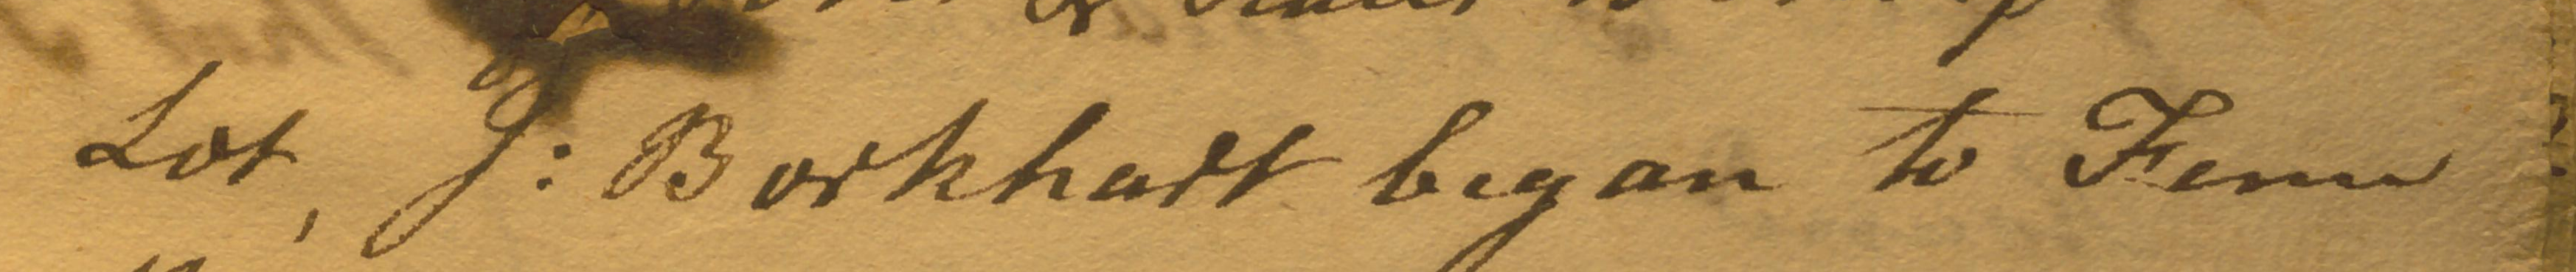Lot, J: Borkhart began to Fence
